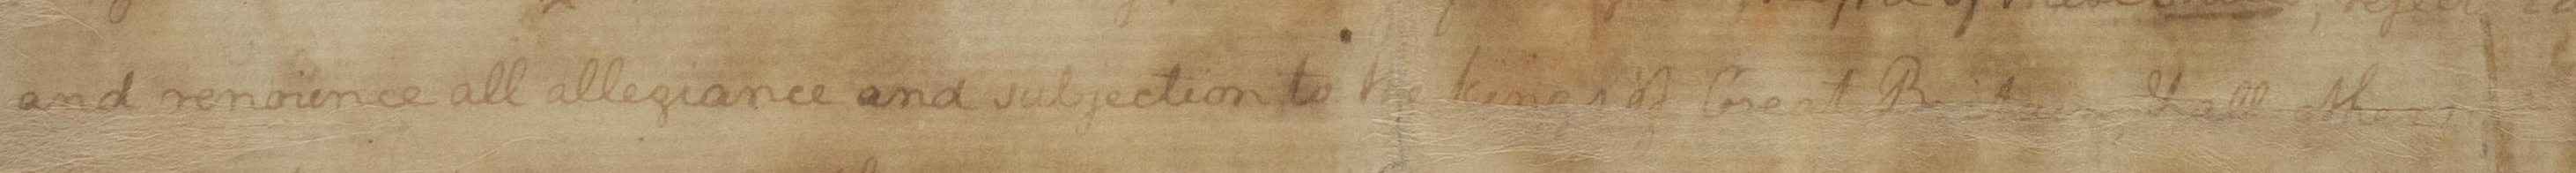and renounce all allegiance & subjection to the kings of Great Britain & all others
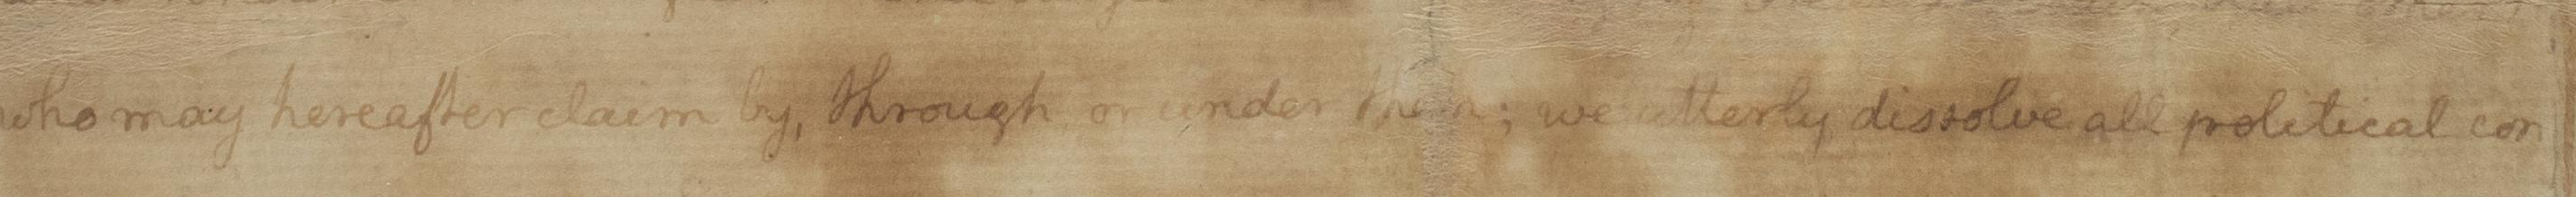who may hereafter claim by, through, or under them; we utterly dissolve & break off all political con-
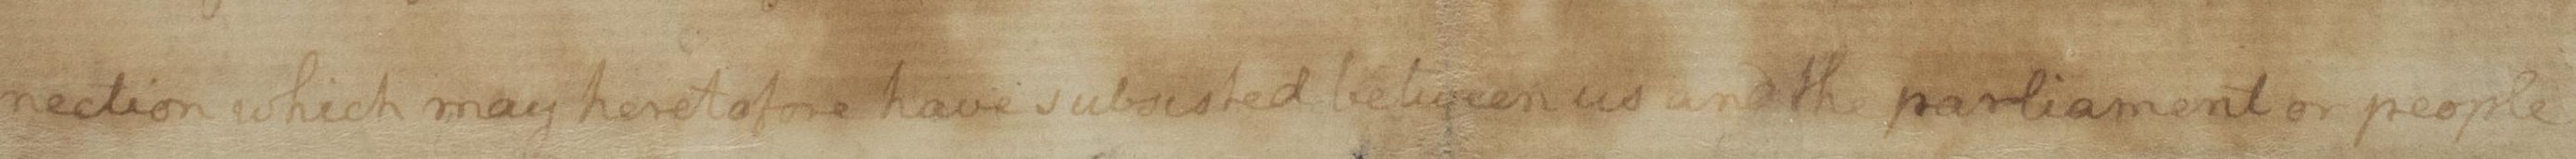-nection which may have heretofore subsisted between us & the parliament or people
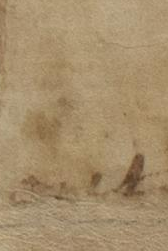over
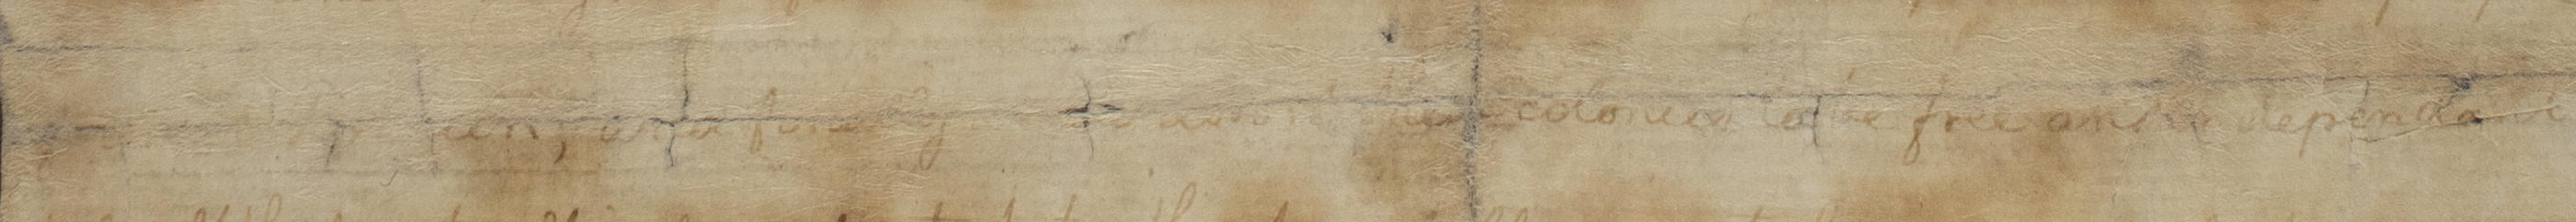[___] colonies to be free and Independent
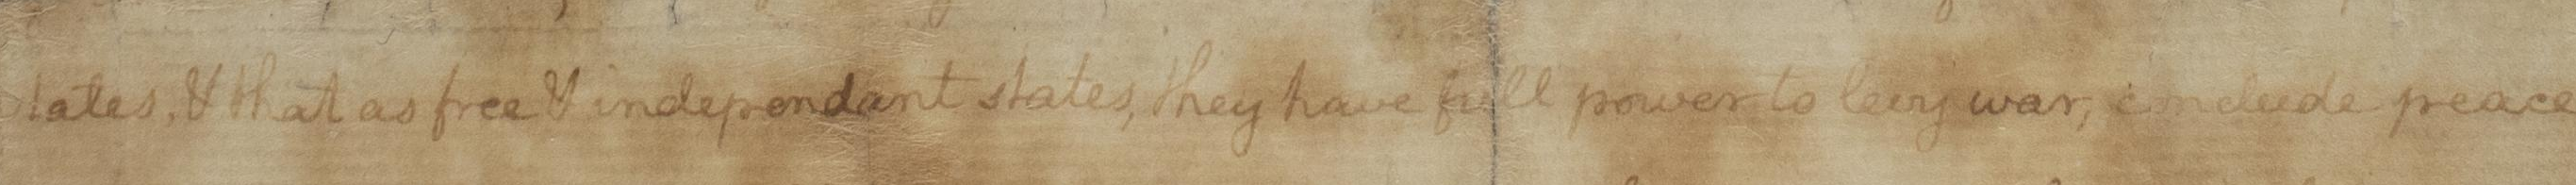states & that as free & independent states they have full power to levy war; conclude peace
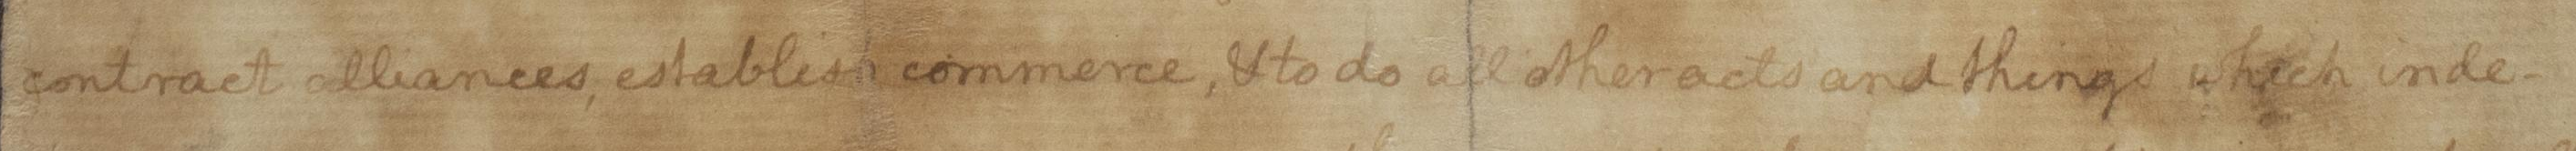contract alliances, establish commerce, & to do a other acts and & things which inde-
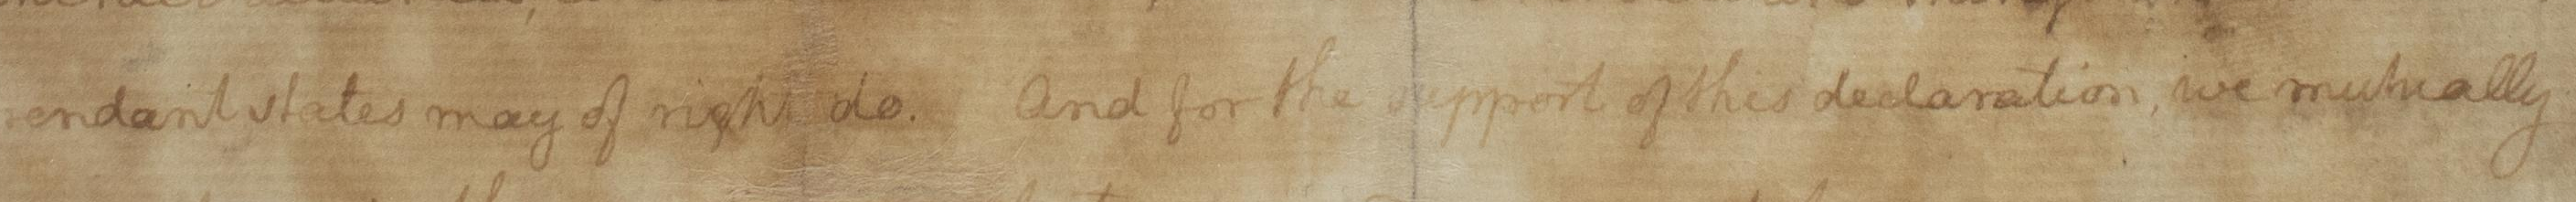-pendant states may of right do and for the support of this declaration, we mutually
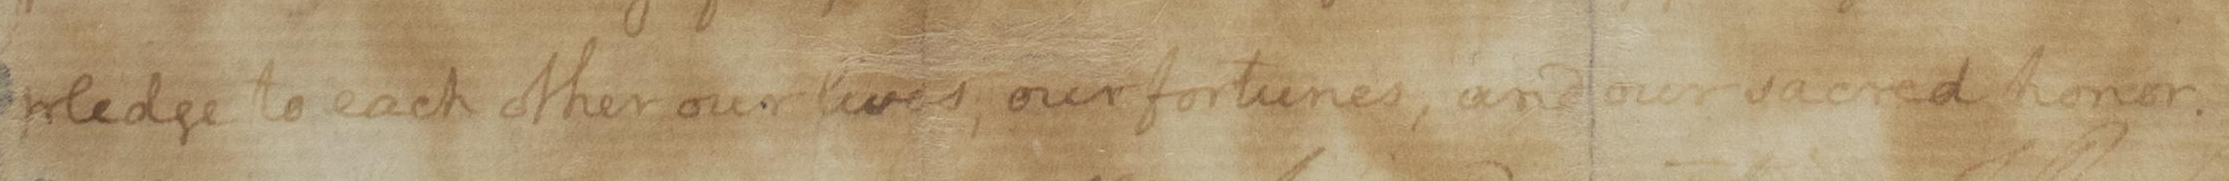pledge to each other our lives, our fortunes, and our sacred honor
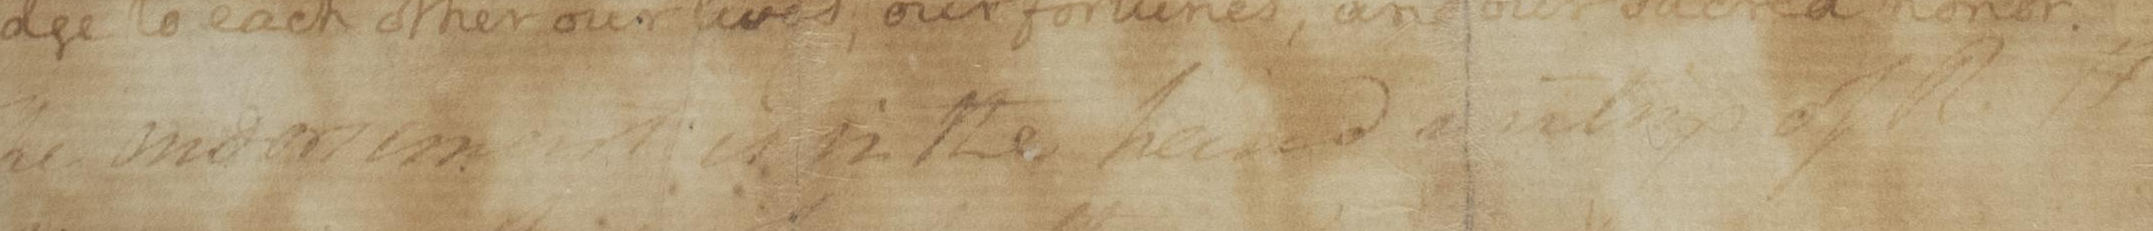The endorsement is in the hand [___] of it
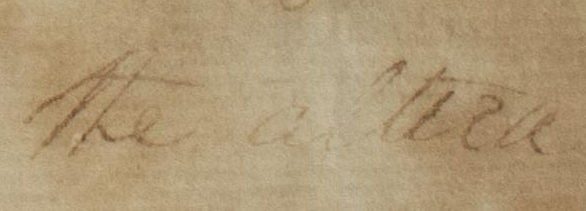the above
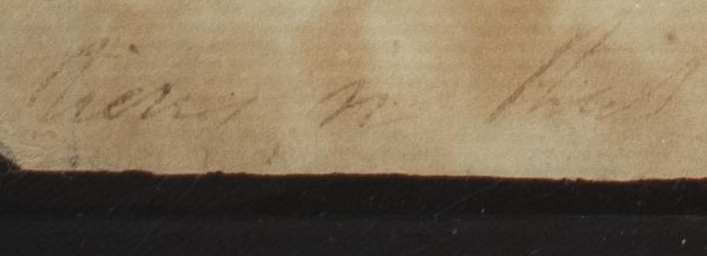things in their
